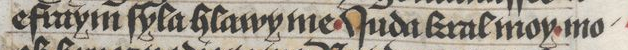eſraym ſyla hlawy me.Iuda kral moy.mo¬
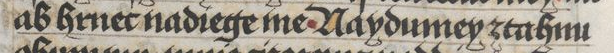ab hrnec nadiege me.Na ydumey ztahnu
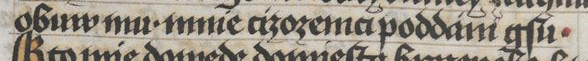obuw mu.mnie cizozemci poddáni gſu.
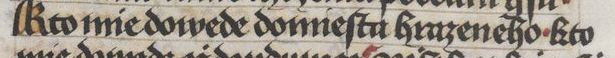Kto mie dowede domieſta hrazeneho.kto
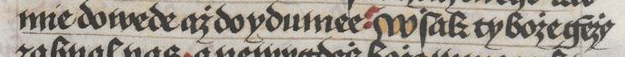mie dowede aż do ydumee?Wẛak ty boże gēżs
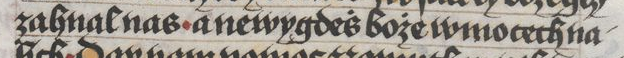zahnal nas.a newygdeṡ boże wmocech na¬
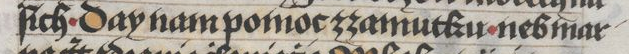ẛich.Day nam pomoc z zamutku.neb mar¬
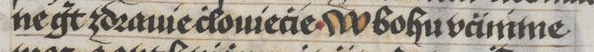ne ḡt zdrauíe ċlouíeċíe.W bohu vċinime
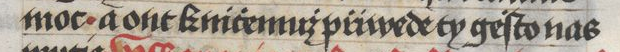moc.a ont kniċemuż pṙiwede ty geẛto nas
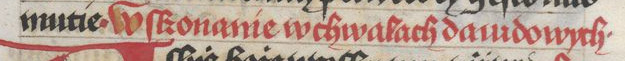mutíe.Wſkonaníe w chwalach dauidowych.
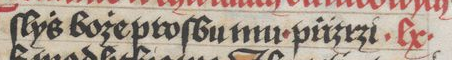ſlyš bože proſbu mu.pṙízrzi.lx.
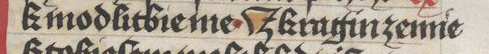k modlitbie me.Zkragín zemie
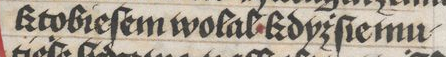ktobieſem wolal.kdyż ſie mu¬
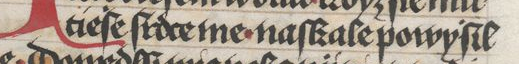tíeẛe ſrdce me.naſkale powyẛil
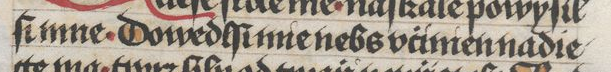ſi mne.Dowedlſi mie nebs vċinien nadie¬
